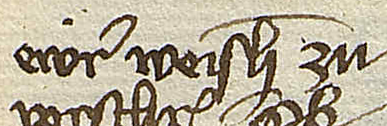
eẅr weiſh* ʒu
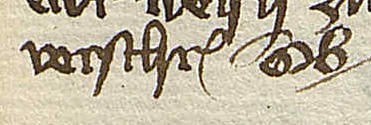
verſchr* / Ob
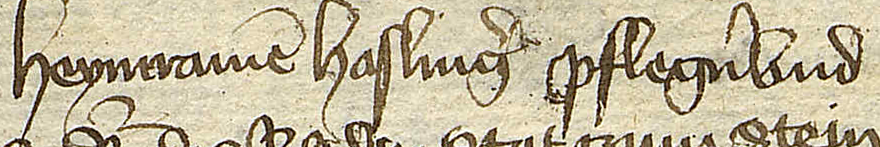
Heymrame* Haſling* pfleg*n vnd
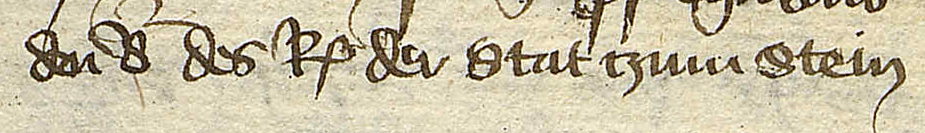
den B* des R* der Stat cʒum Stein
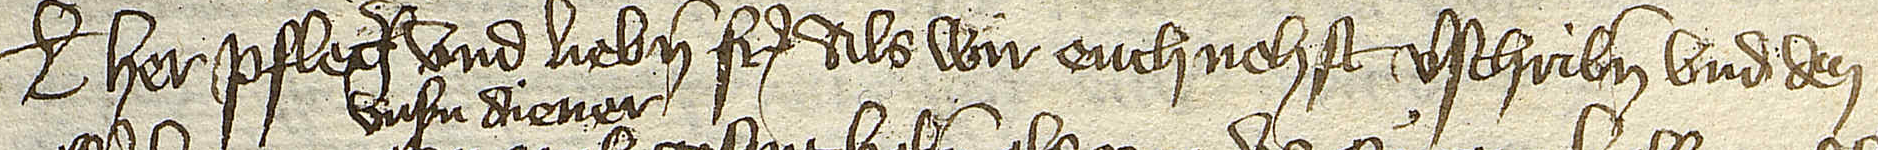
L* her pfleg* vnd lieb*n fr* Als wir euch nehſt v*ſchrib*n vnd den
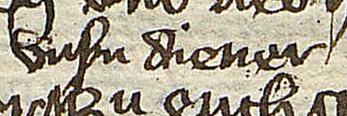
vnſ*n diener
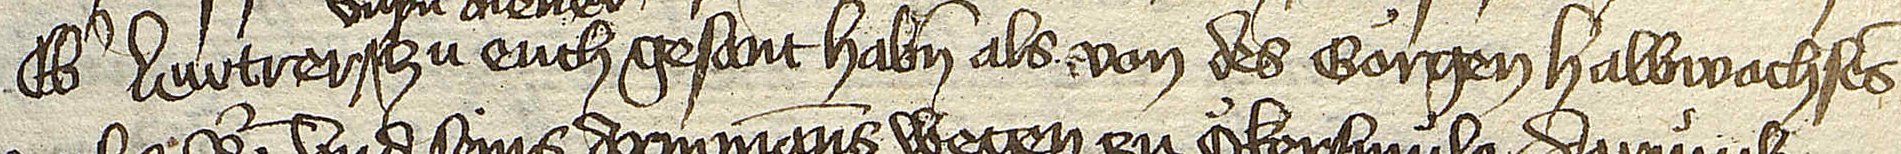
Eb* lewtrer cʒu euch geſant hab*n als von des Görgen halbwachſes*
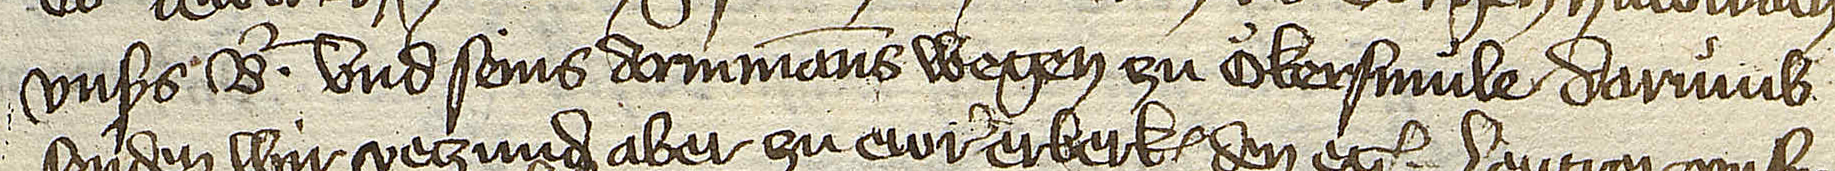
vnſ*s B* . vnd ſeins Armmans* wegen cʒu Ökerſmüle / darümb
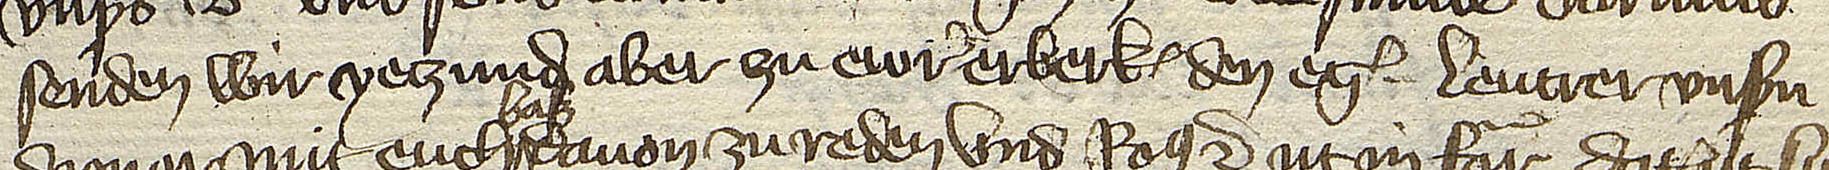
ſenden wir yecʒund aber cʒu ewr* erberk* den eg* . leutrer vnſ*n
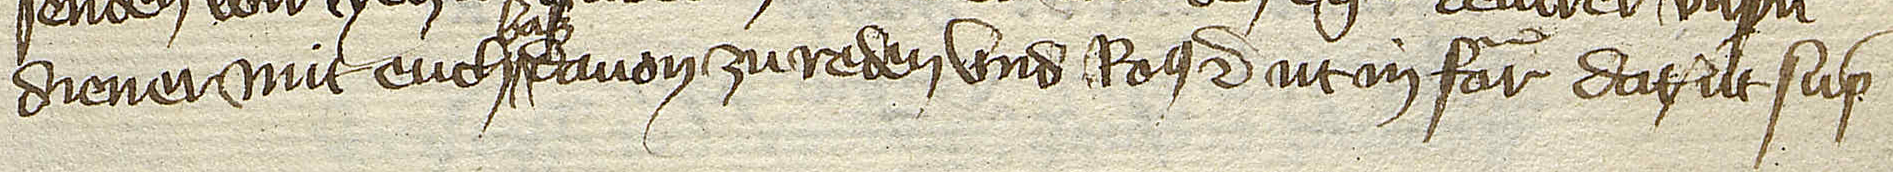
diener mit euch dauon cʒu reden vnd Ro* ec ut in for* dat* ut ſup*
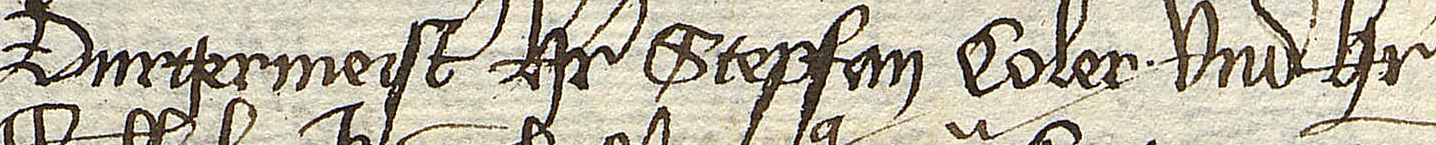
Burgermeiſt* H*r Stepfan Coler . Vnd H*r
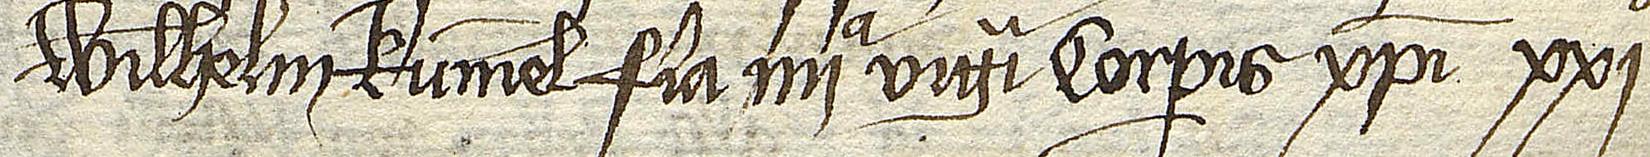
Wilhelm Rum*el fia* iiii* vigi* Corpis* xpi* xxi*
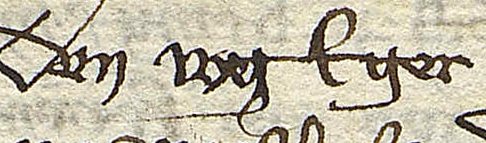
Den von Eger
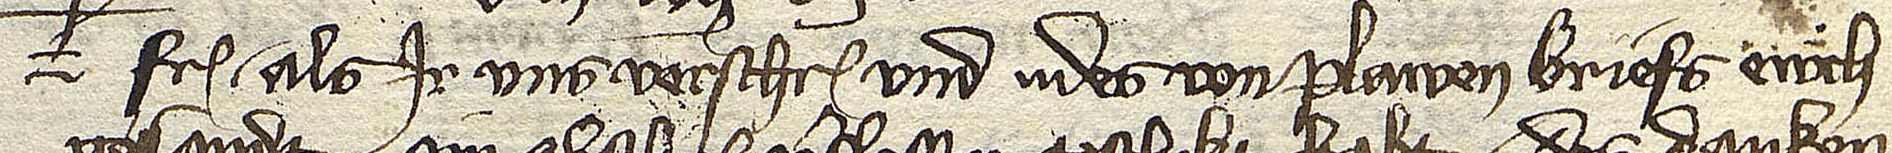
L* fr* / als Ir vns verſchr* vnd ~ des von Plawen eẅch
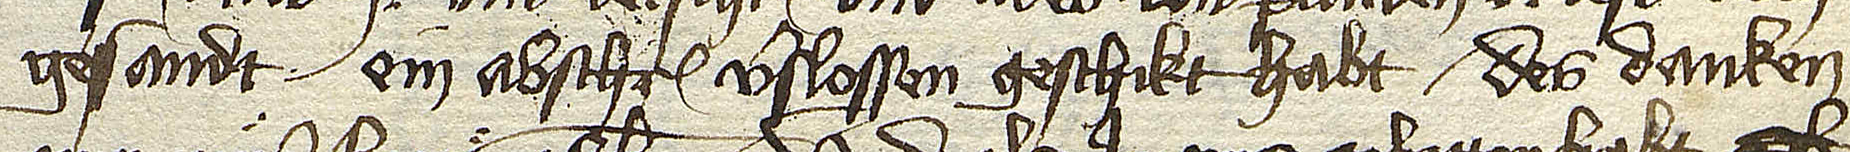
geſandt ein abſchr* v*ſloſſen geſchikt habt / Des danken
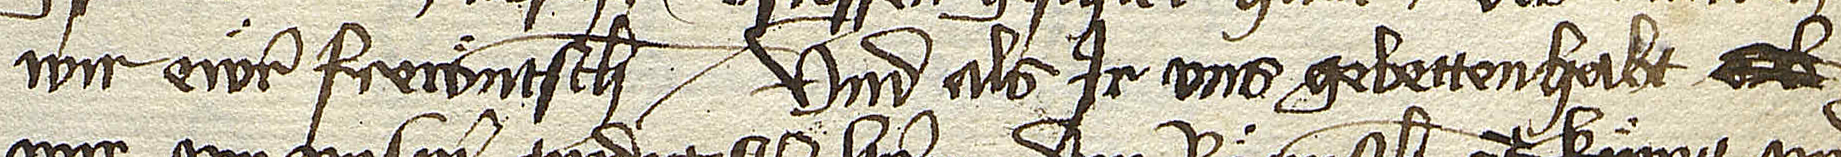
wir eẅr* freẅntſch* / Vnd als Ir vns gebetten habt Ob
